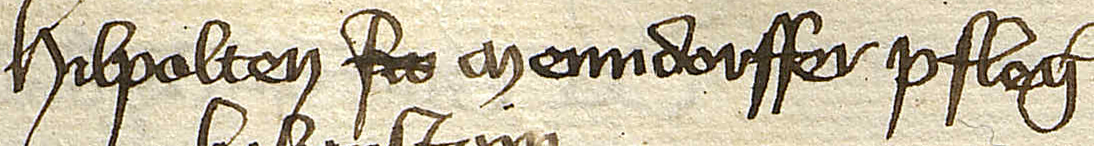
Hilpolten Fra Menndorffer Pfleg*
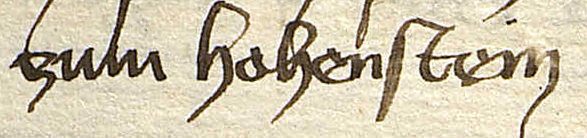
cʒum Hohenſein
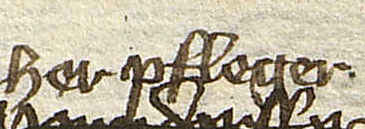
her pfleger .
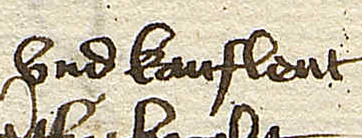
vnd kaufleut
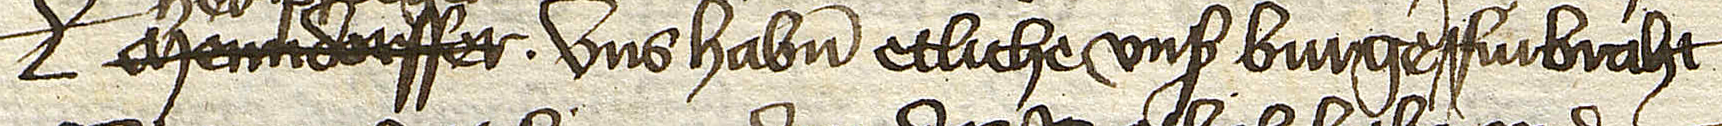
L* Menndorffer . Vns habn* ettliche vnſ* burge* fürbraht
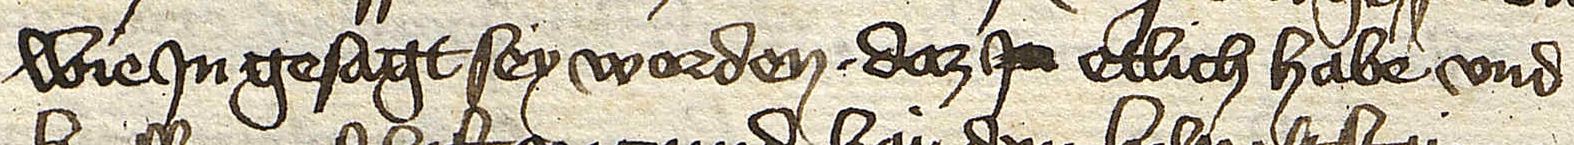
wie In geſagt ſey worden / daʒ In etlich habe vnd
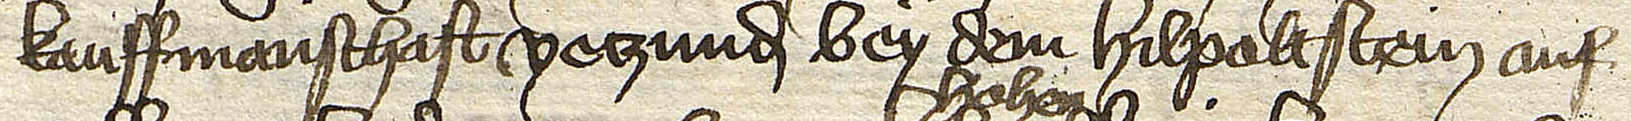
kauffmanſchaft yecʒund* bey dem hilpoltſtein auf
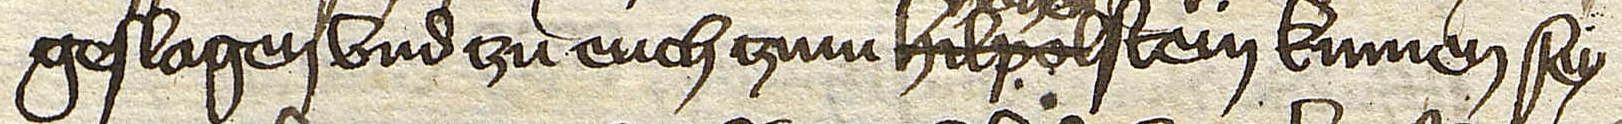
geſlagen vnd cʒu euch cʒum hilpolſtein kumen ſey
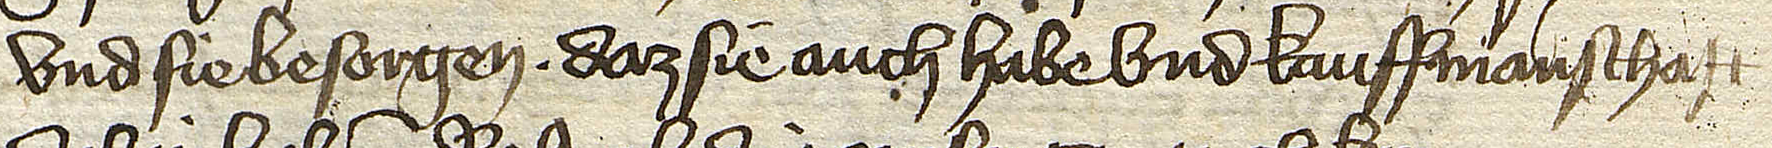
vnd ſie beſorgen . daʒ ſie auch habe vnd kauffmanſchaft
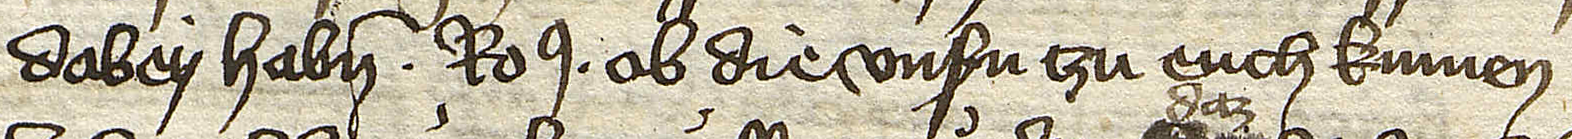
dabey habn* . Ro* . ob die vnſ*n cʒu euch kumen
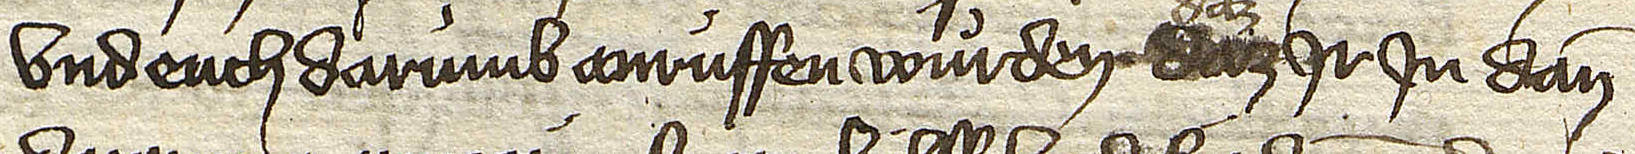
vnd euch daümb anrüffen würden daʒ Ir In dan*
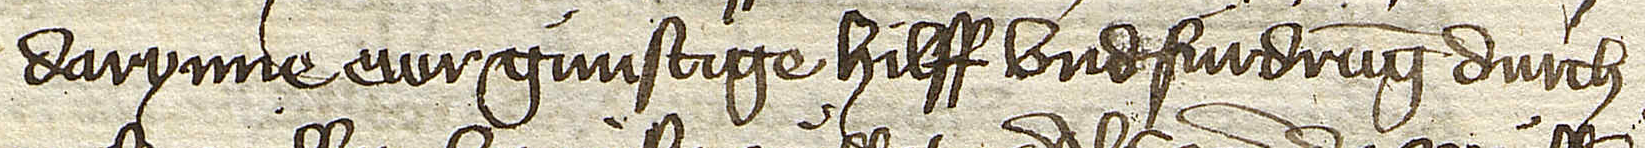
darynne ewr günſtige hilff vnd fürdru*g durch
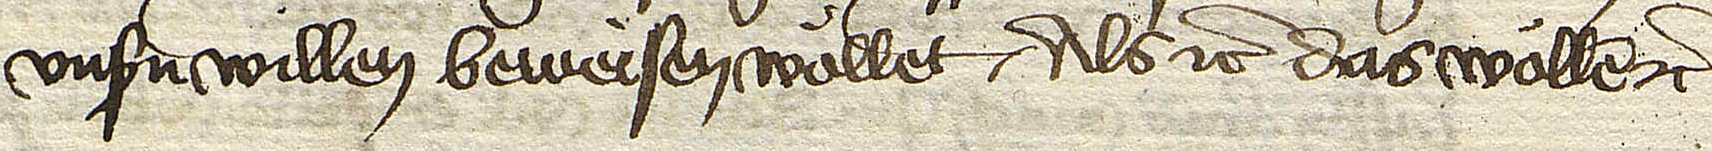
vnſ*n willen beweiſen wöllet / Als ec* das wölle* ec*
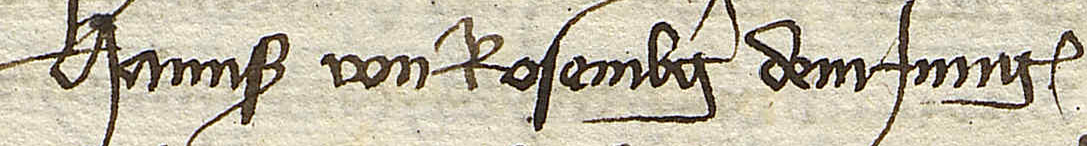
Hannſ* von Roſemb*g dem Iung*
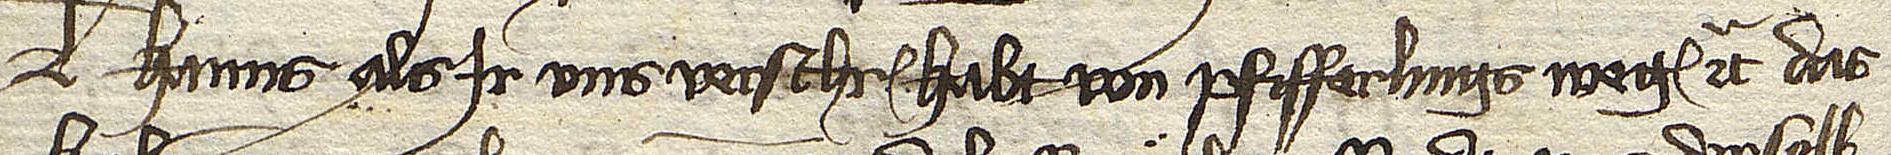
L* hanns als Ir vns verſchr* habt von pfifferlings weg* ec* das
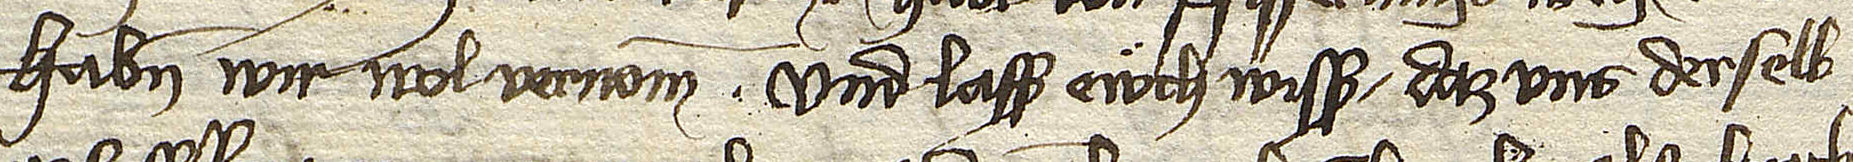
habn* wir wol vernom* . vnd laſſ* eẅch wiſſ* / daʒ vns derſelb
